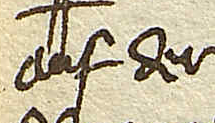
auf der
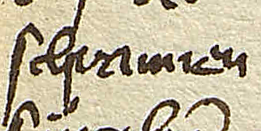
ſchrannen
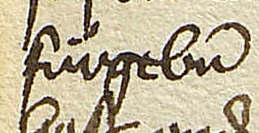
fürgebn*
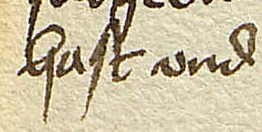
haſt vnd
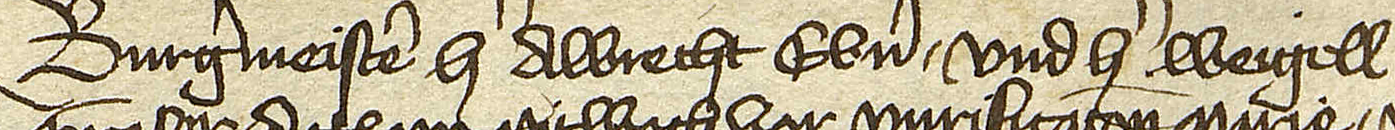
Burg*meiſte* h* Albrecht Ebn* / vnd h* weigell
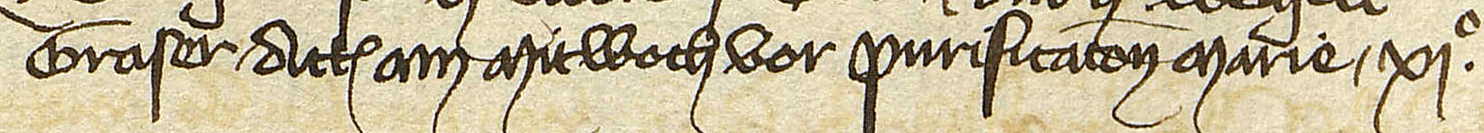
Graſer / Act* am Mitwoch vor Purificacon* Marie / xi* .
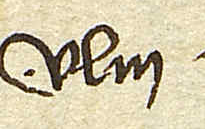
. Vlm .
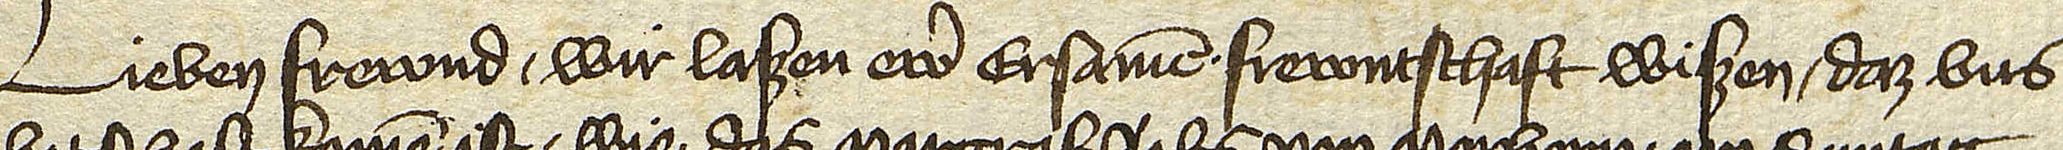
Lieben frewnd / wir laſʒen ew* Erſame* frewntſchaft wiſʒen / daʒ vns
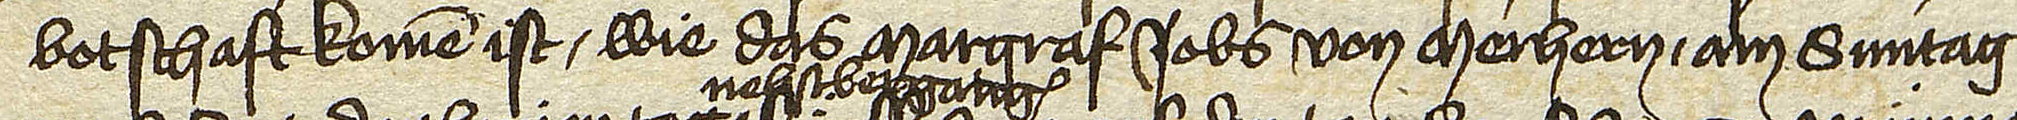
botſchaft kome* iſt / wie das Margraf Iobs von Merhern / am Suntag
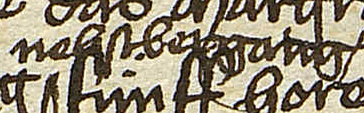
nehſtvergang*
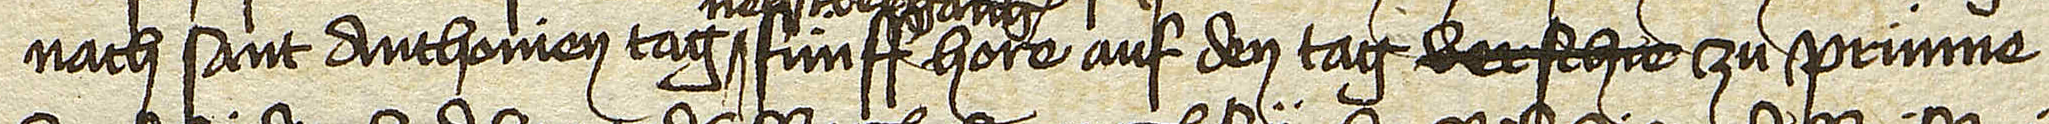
nach ſant Anthonien tag fünff hore auf den tag verſchie cʒu Prünne
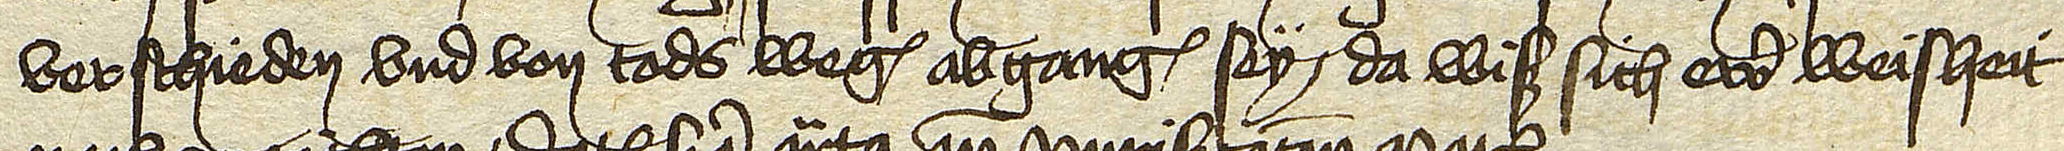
verſchieden vnd von tods weg* abgang* ſey / da wiſʒ ſich ew* weiſheit
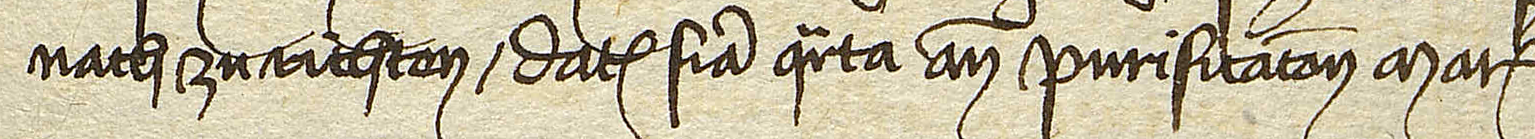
nach cʒu richten / dat* fia* qrta* an* Purificacon* Mar*
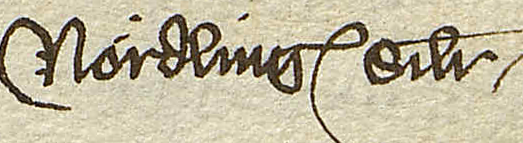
Nördling* Silr* /
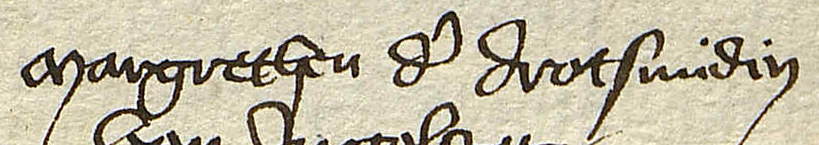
Margrethen d* Drotſmidin
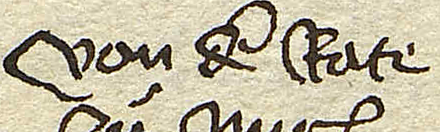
von d* Rate
